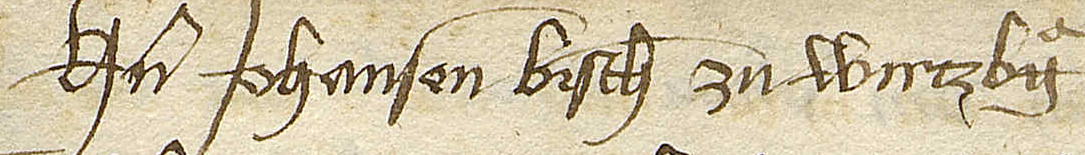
Hn* Iohanſen biſch* ʒu Wircʒb*g
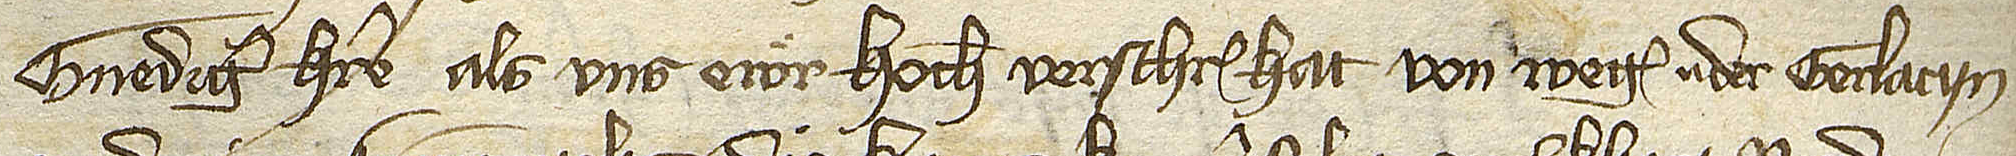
Gnedig* h*re als vns eẅr Hoch* verſchr* hat von weg* ~ der Gerlacyn
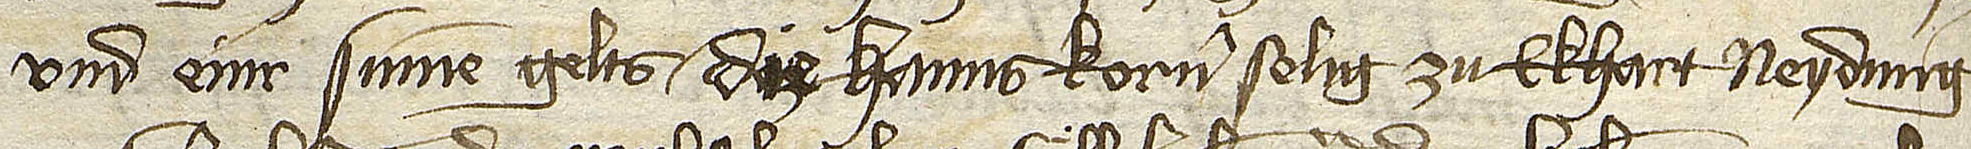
vnd einr ſum*e gelts / Die hanns korn* ſelig ʒu Ekhart Neydung
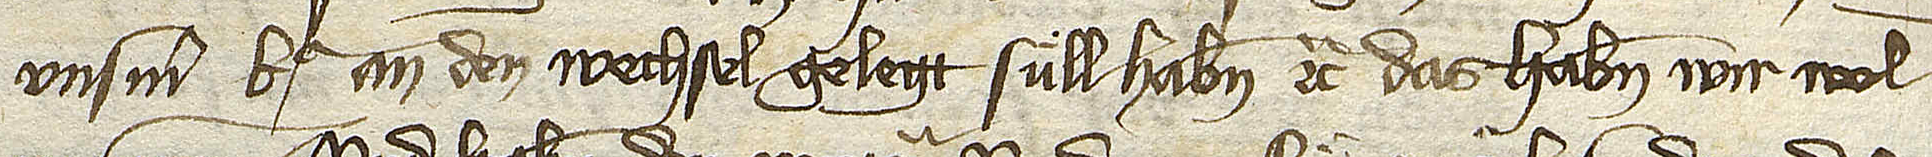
vnſm* b* an den wechſel gelegt ſüll habn* ec* das habn* wir wol
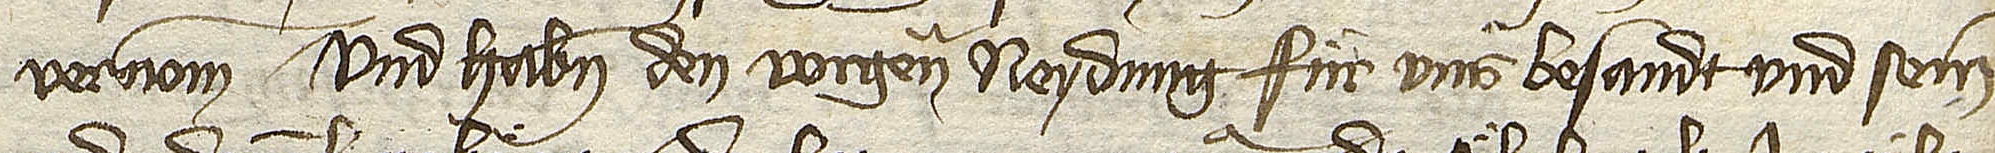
vernom* / Vnd habn* den vorgen* Neydung für vns beſandt vnd ſein*
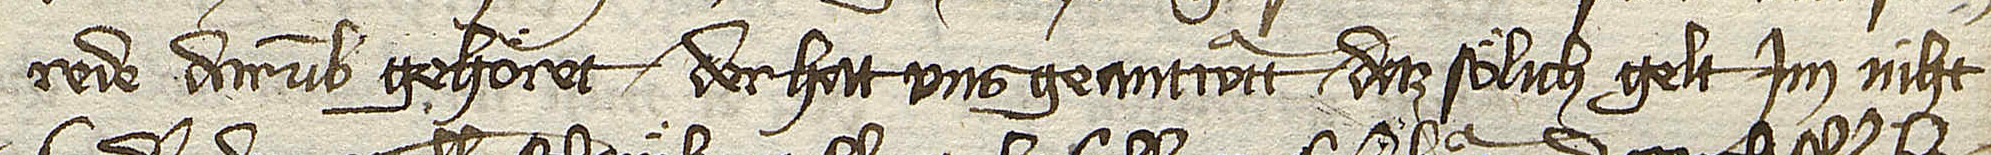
rede darub* gehöret / der hat vns geantw*tt / daʒ ſölich gelt Im niht
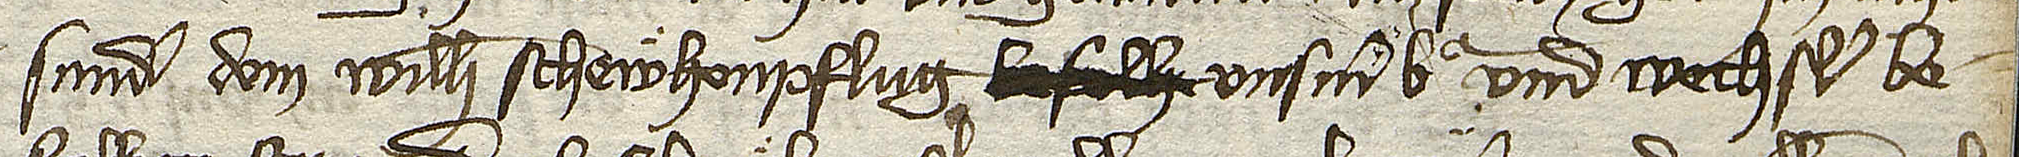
ſund* dem wilh* ſcheẅhenpflug befolh vnſm* b* vnd wechſl* be =
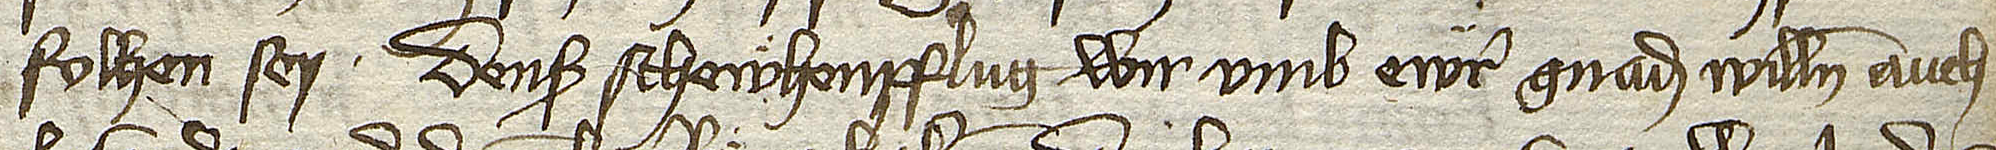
folhen ſey . Denſ* ſcheẅhenpflug wir vmb eẅr* gnad* willn* auch
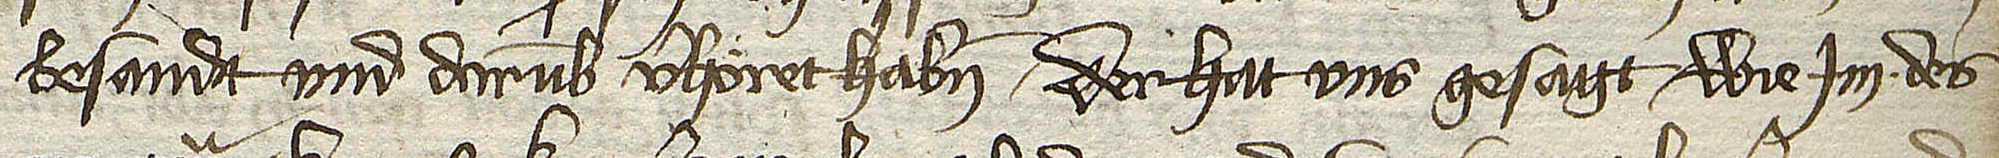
beſandt vnd darub* v*höret habn* / Der hat vns geſagt / wie Im des
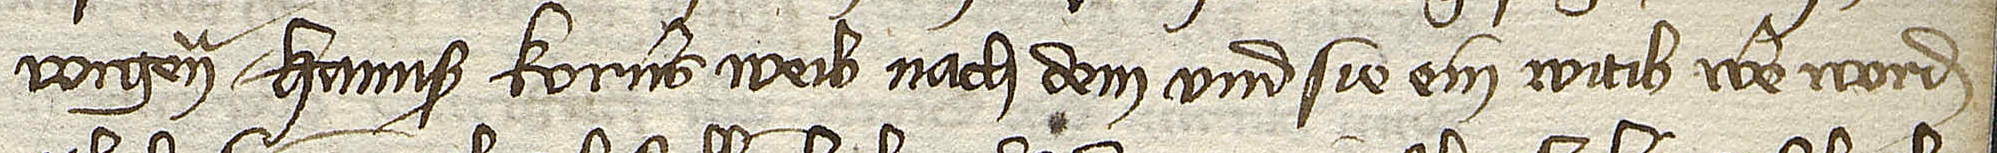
vorgen* / Hannſ* Korn*s weib nach dem vnd ſie ein witib w*e word*
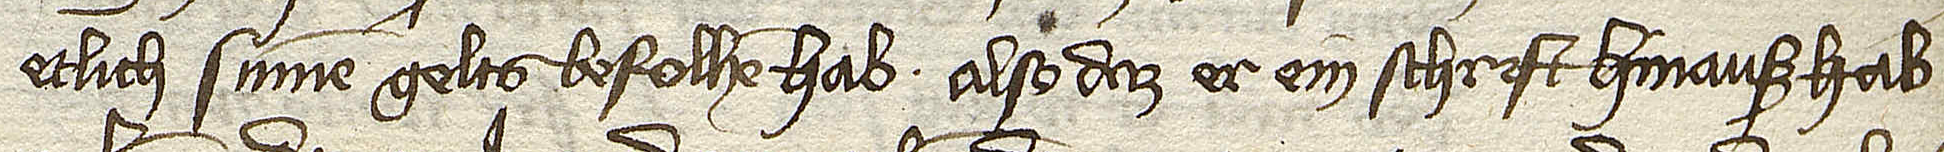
etlich ſum*e gelts befolhe* hab . alſo daʒ er ein ſchrift hinauſʒ hab
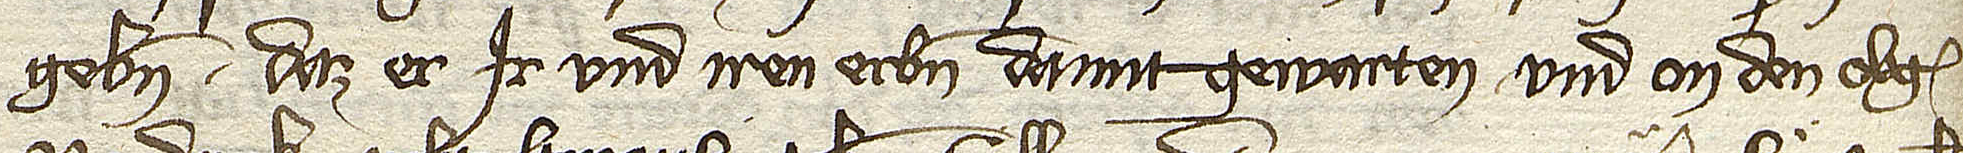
gebn* / daʒ er Ir vns iren erbn* damit gewarten / vnd on den obg*
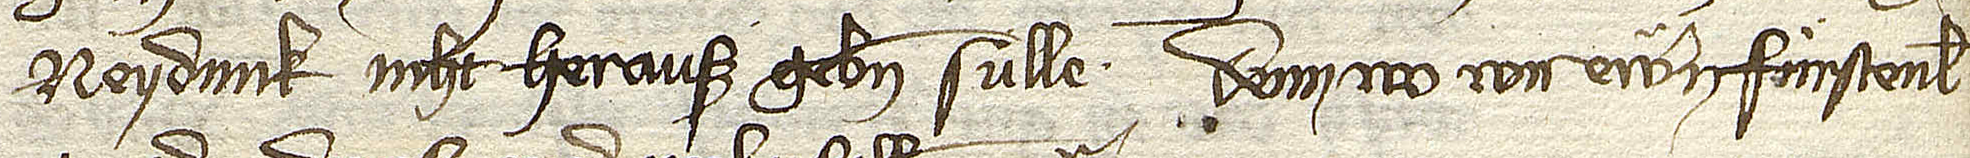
Neydunk niht herauſʒ gebn* ſülle . Denn wo wir eẅ*n fürſtenl*
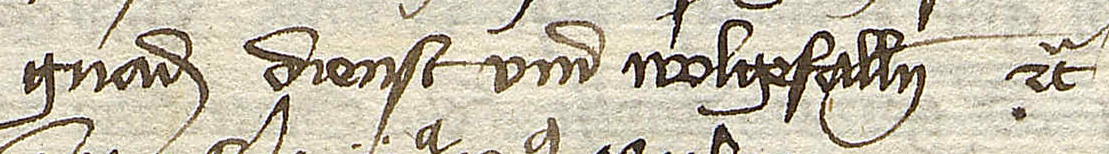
gnad* dienſt vnd wolgefalln* ec*
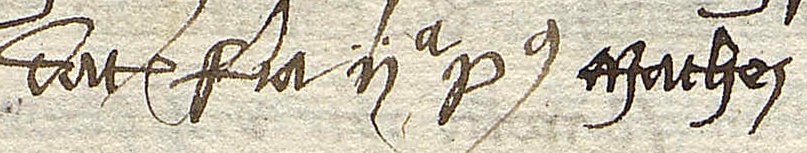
Dat* fi*a ii* p* Mathei
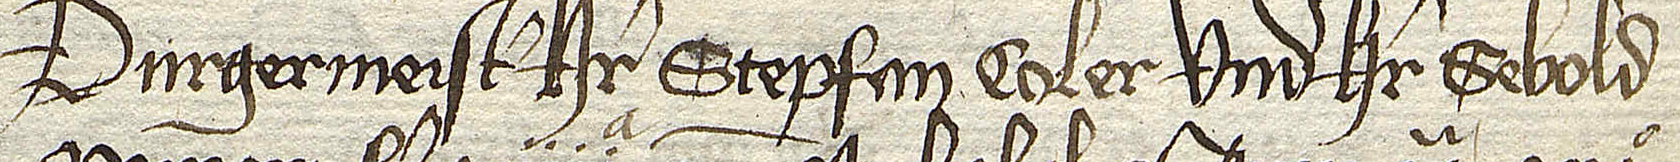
Burgermeiſt* Hr* Stepfan Coler Vnd Hr* Sebold
